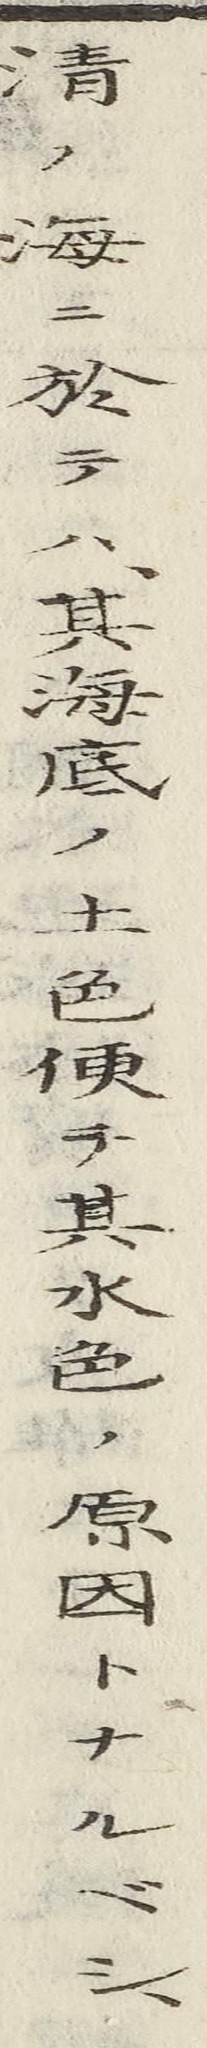清ノ海ニ於テハ、其海底ノ土色便チ其水色ノ原因トナルベシ、
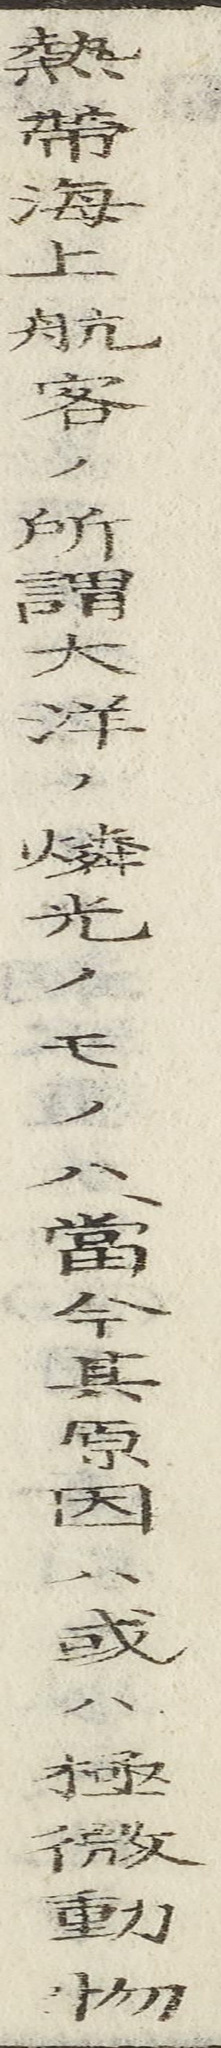熱帯海上航客ノ所謂大洋ノ燐光ノモノハ、当今其原因ハ或ハ極微動物
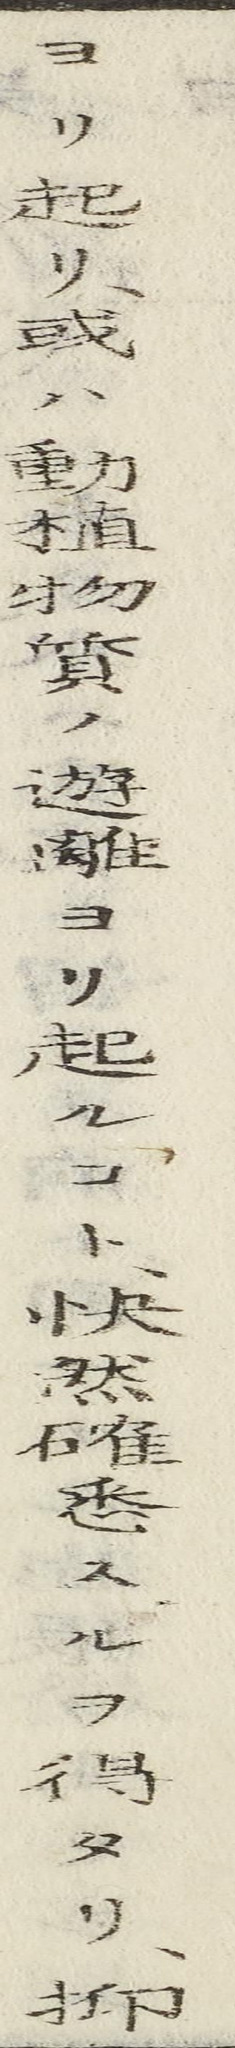ヨリ起リ、或ハ動植物質ノ遊離ヨリ起ルコト、快然確悉スルヲ得タリ、抑
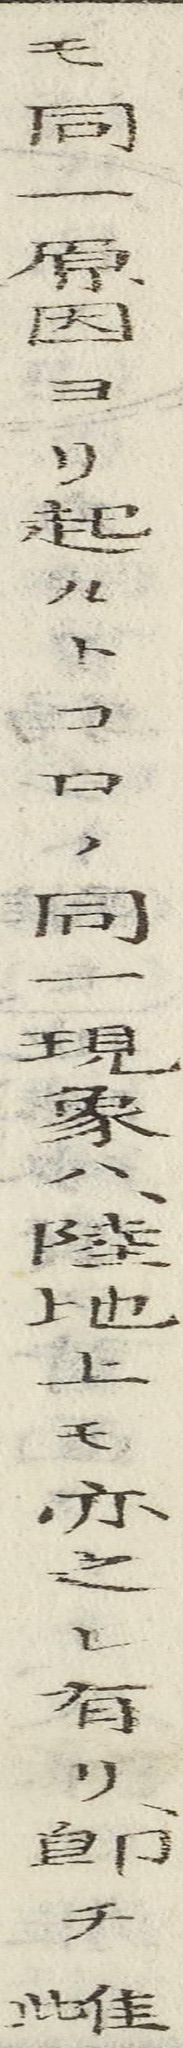モ同一原因ヨリ起ルトコロノ同一現象ハ、陸地上モ亦之レ有リ、即チ雌
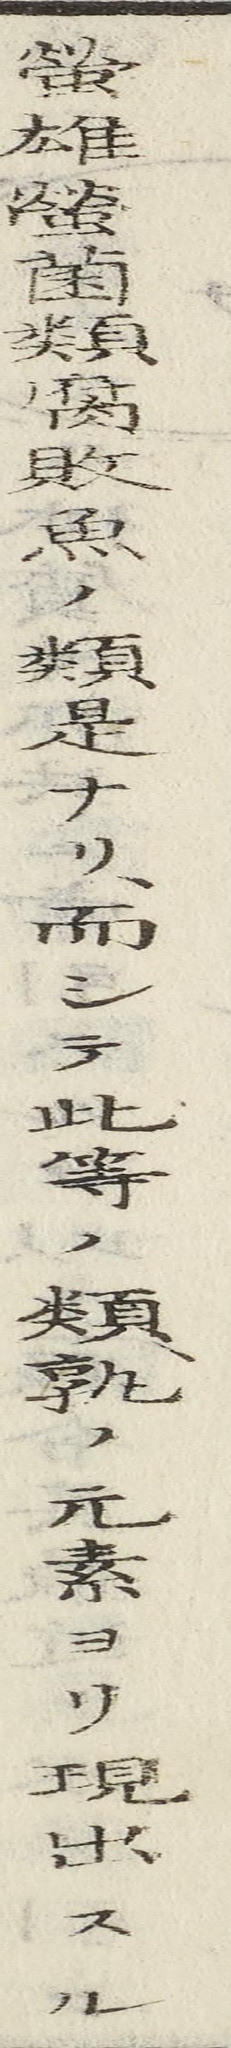蛍雄蛍菌類腐敗魚ノ類是ナリ、而シテ此等ノ類孰ノ元素ヨリ現出スル
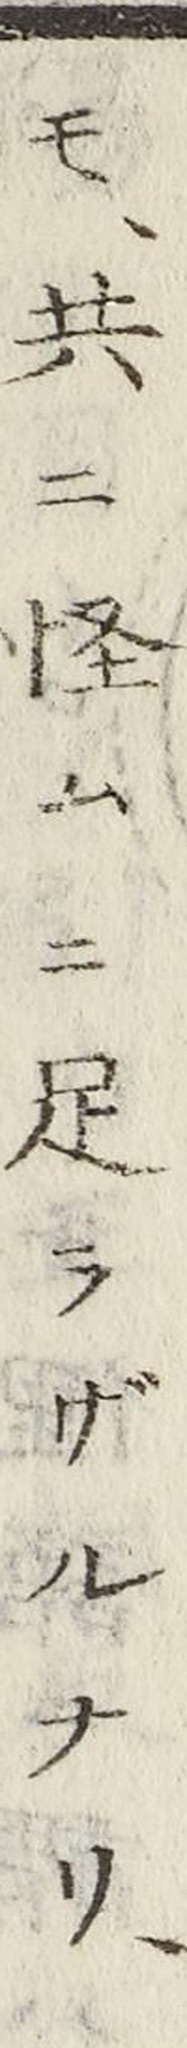モ、共ニ怪ムニ足ラザルナリ、
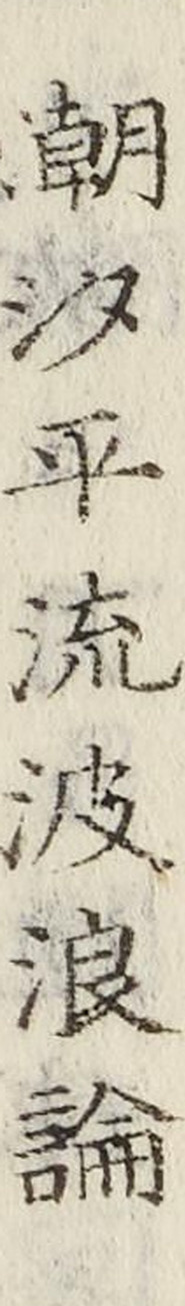潮汐平流波浪論
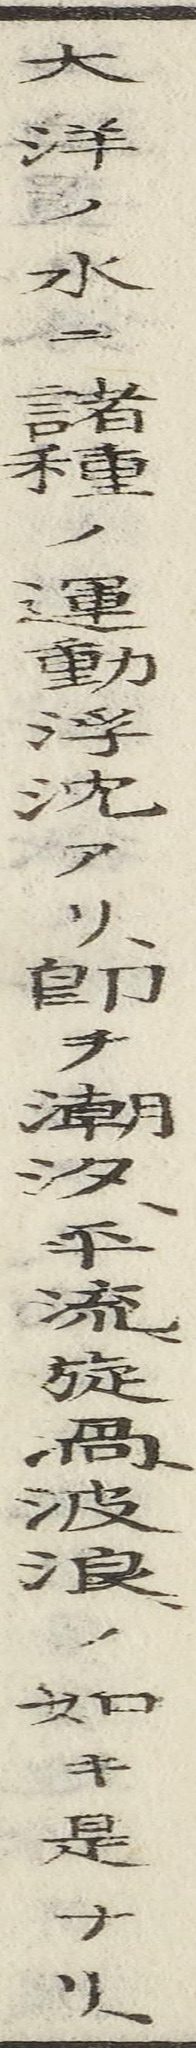大洋ノ水ニ緒類ノ運動浮沈アリ、即チ潮汐、平流、旋渦、波浪、ノ如キ是ナリ、
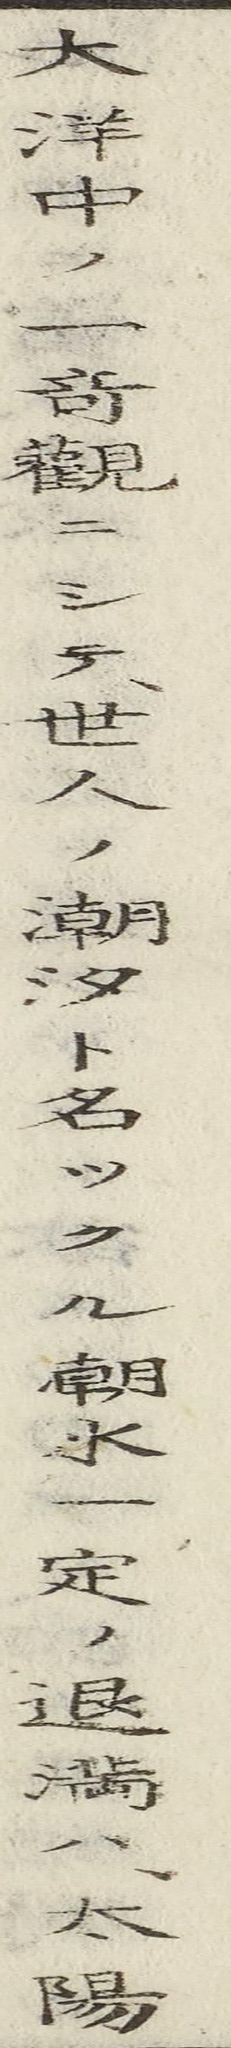大洋中ノ一奇観ニシテ、世人ノ潮汐ト名ツクル潮水一定ノ退満ハ、太陽
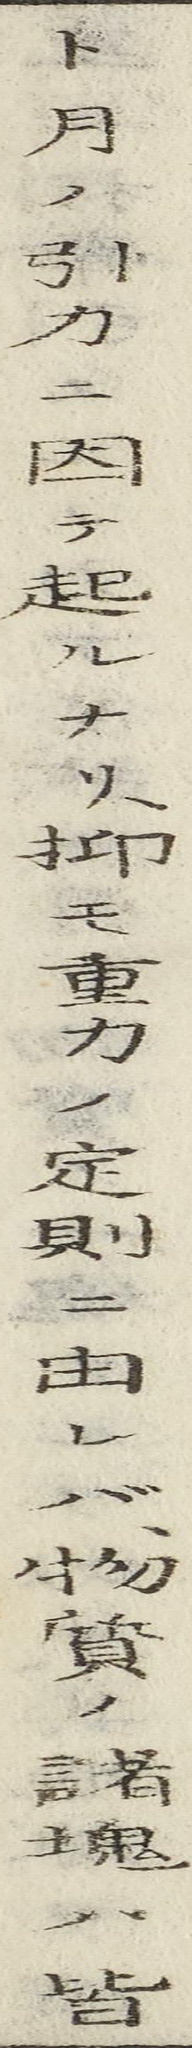ト月ノ引力ニ因テ起ルナリ、抑モ重力ノ定則ニ由レバ、物質ノ諸塊ハ皆

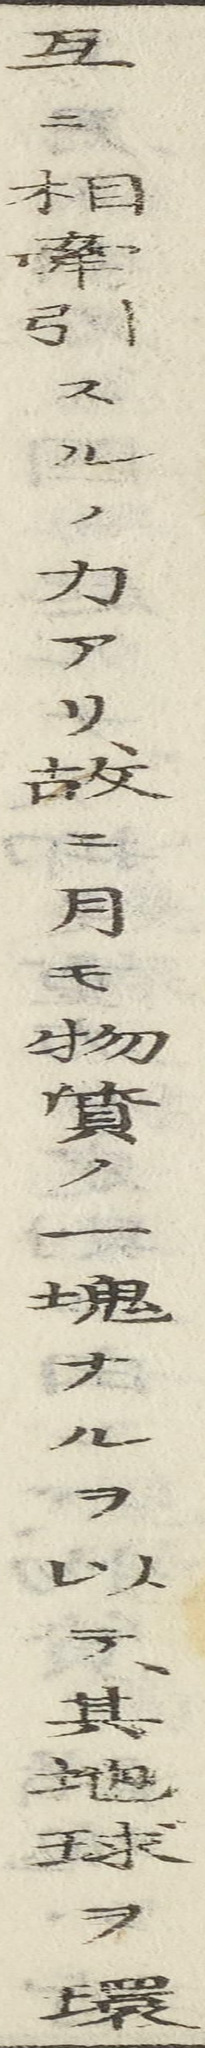互ニ相牽引スルノ力アリ、故ニ月モ物質ノ一塊ナルヲ以テ、其地球ヲ環
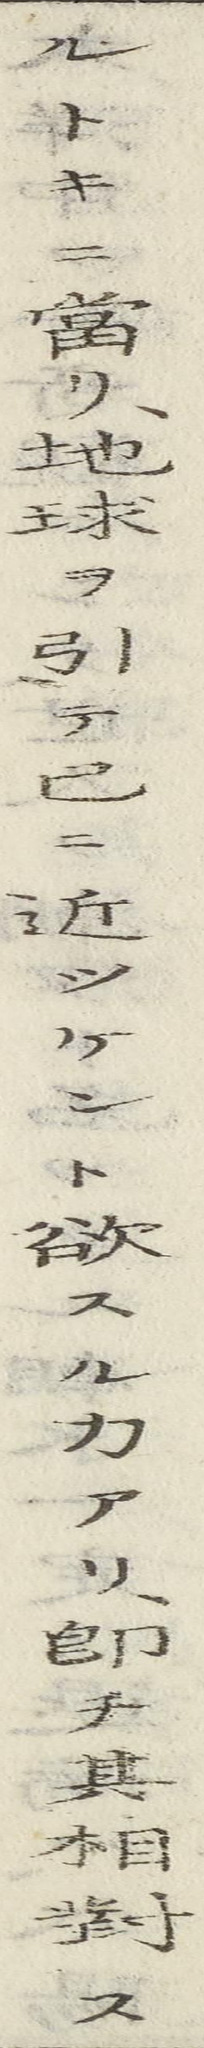ルトキニ当リ、地球ヲ引テ己ニ近ツケント欲スル力アリ、即チ其相対ス
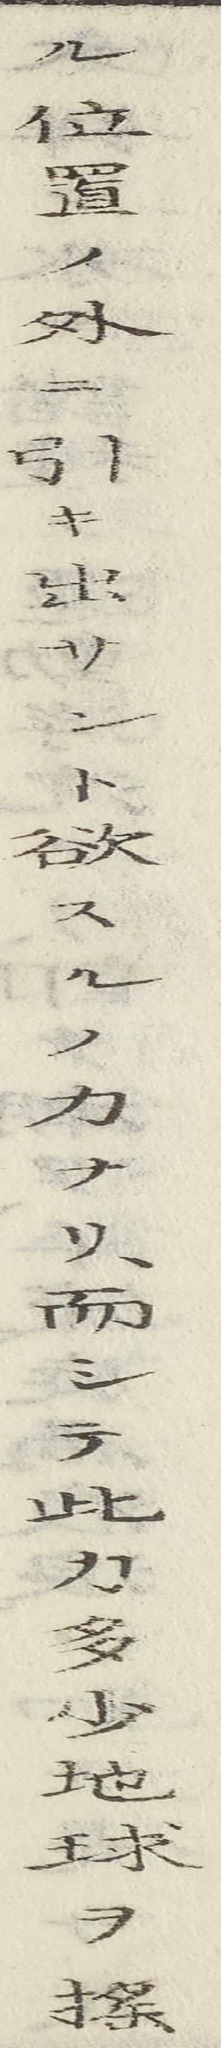ル位置ノ外ニ引キ出サント欲スルノ力ナリ、而シテ此力多少地球ヲ揺
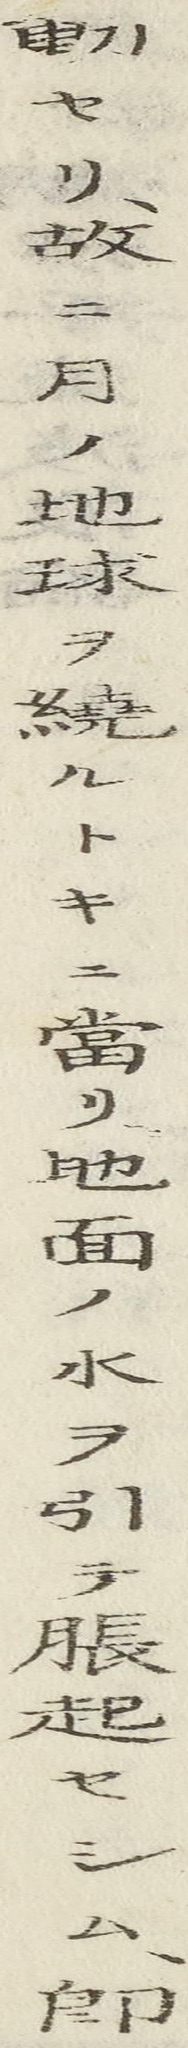動セリ、故ニ月ノ地球ヲ繞ルトキニ当リ地面ノ水ヲ引テ脹起セシム、即
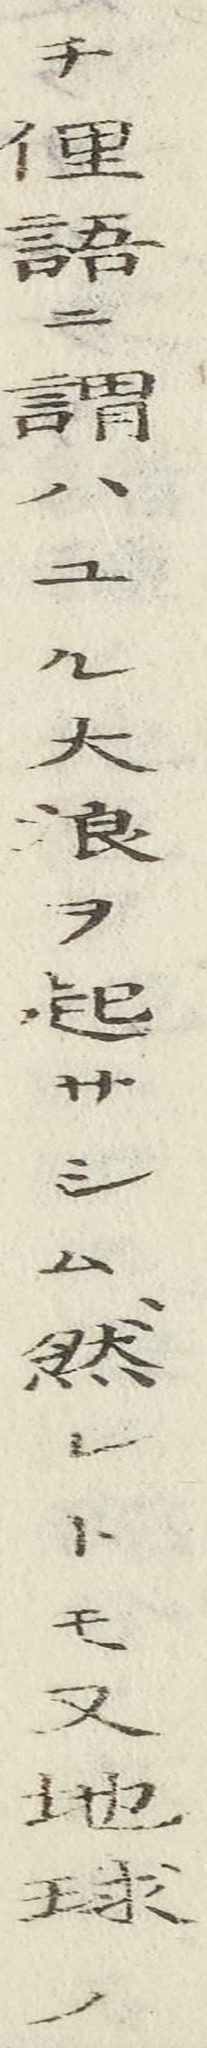ロチ俚語ニ謂ハユル大浪ヲ起サシム、然レトモ又地球ノ
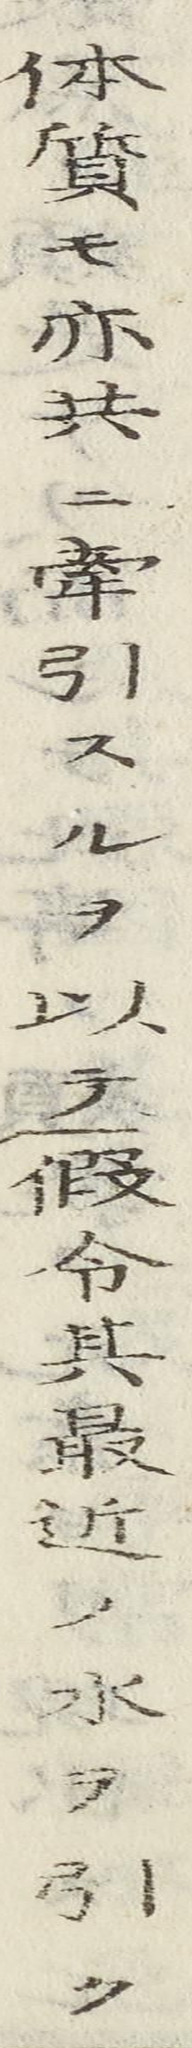体質モ亦共ニ牽引スルヲ以テ（仮令其最近ノ水ヲ引ク
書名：百科全書　地文學　全
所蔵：東京大学地震研究所図書室 Earthquake Research Institute Library, The University of Tokyo, JAPAN
